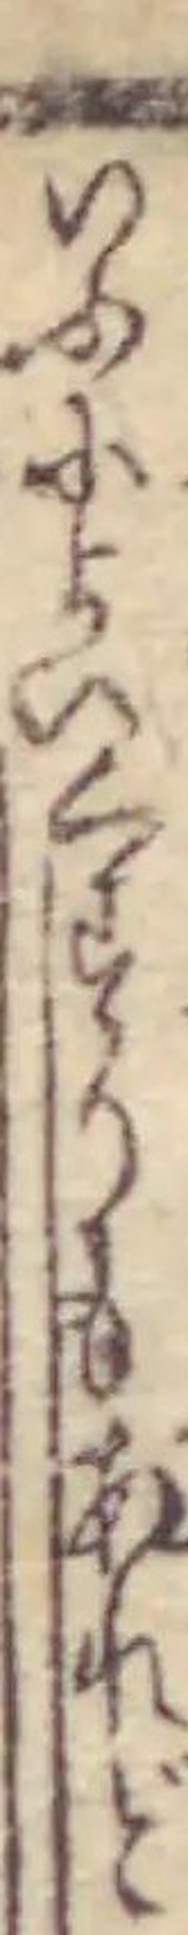いふによいくすりもあれど
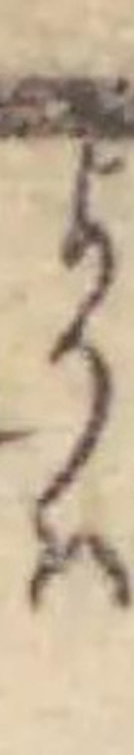よりは
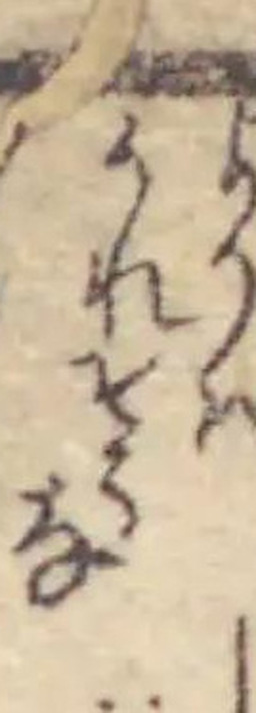うれそうな
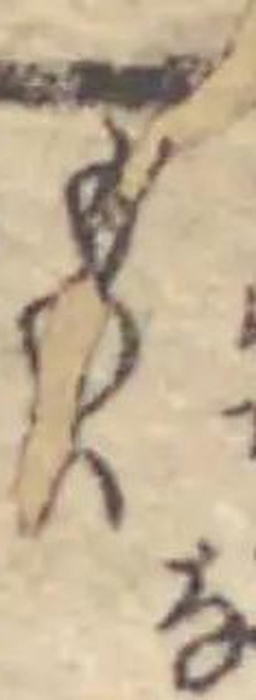ものは
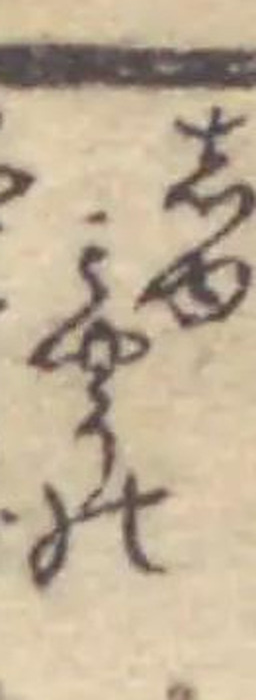みやうの
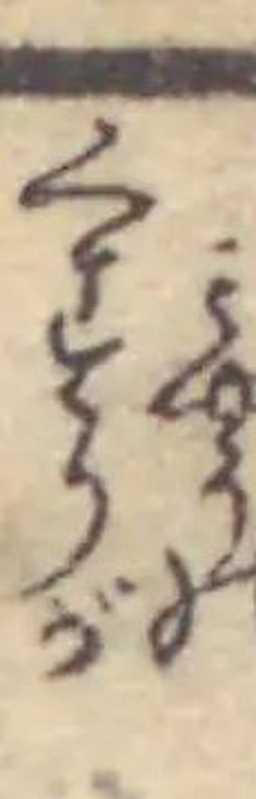くすりが
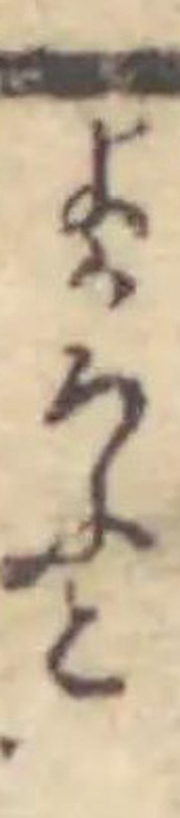よかろふと
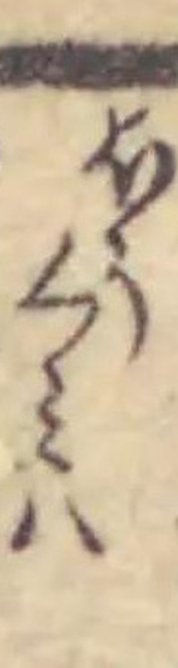ほうくみは
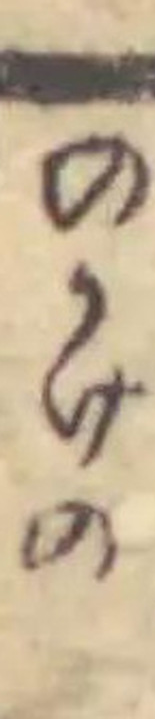のかけの
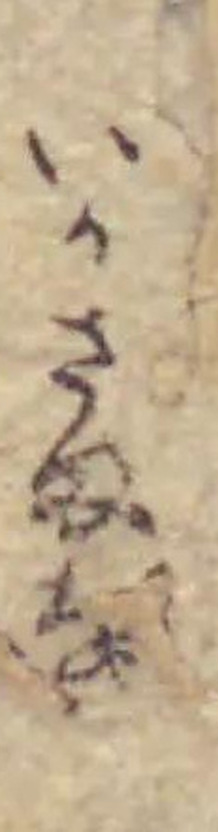いかさまな
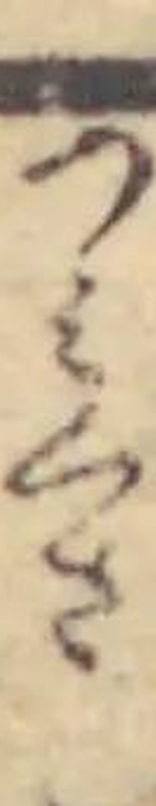つみくさ
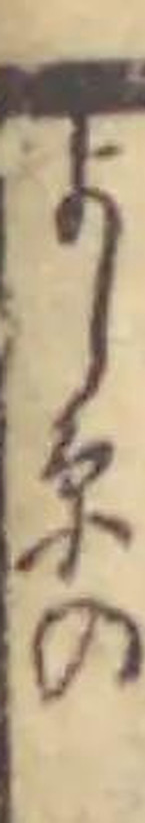よし原の
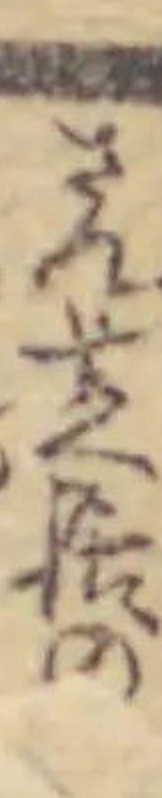さん芝居の
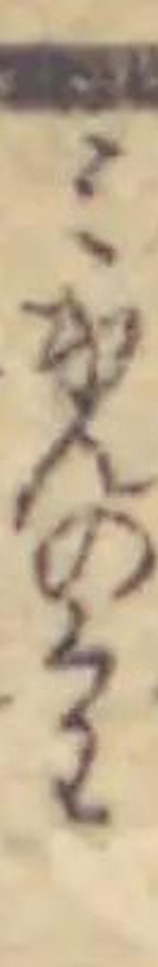みかんのかわ
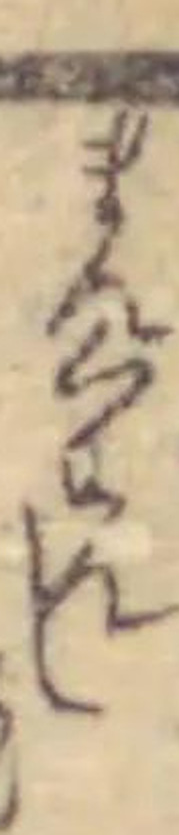まんくわんしても
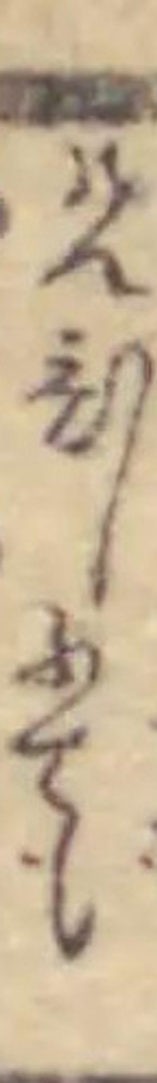けんひしにても
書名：家伝寿命薬 2巻
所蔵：国立国会図書館 National Diet Library, JAPAN
